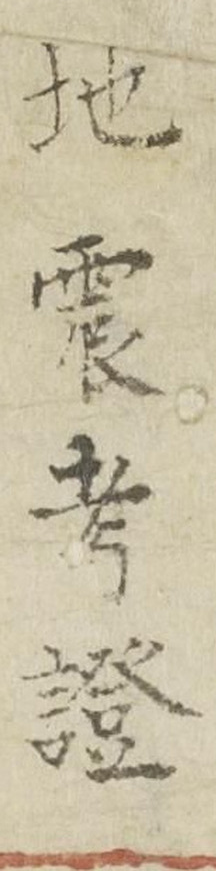地震考証
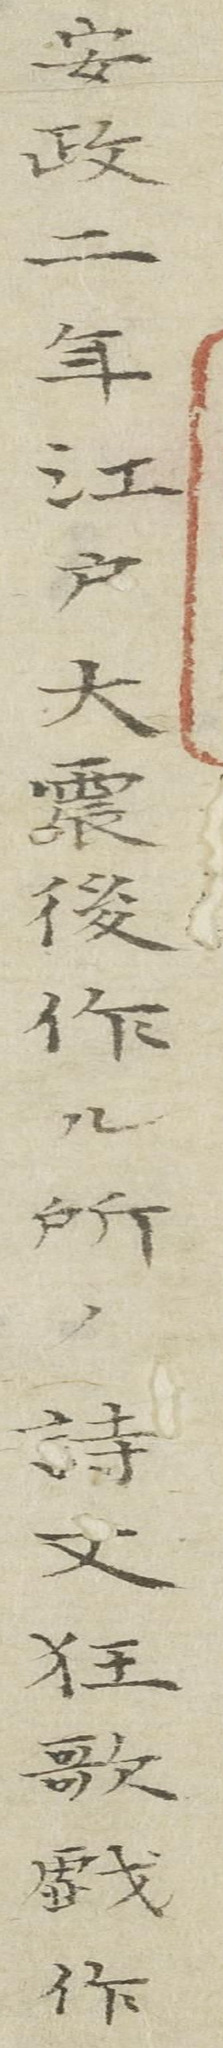安政二年江戸大震後作ル所ノ詩文狂歌戯作
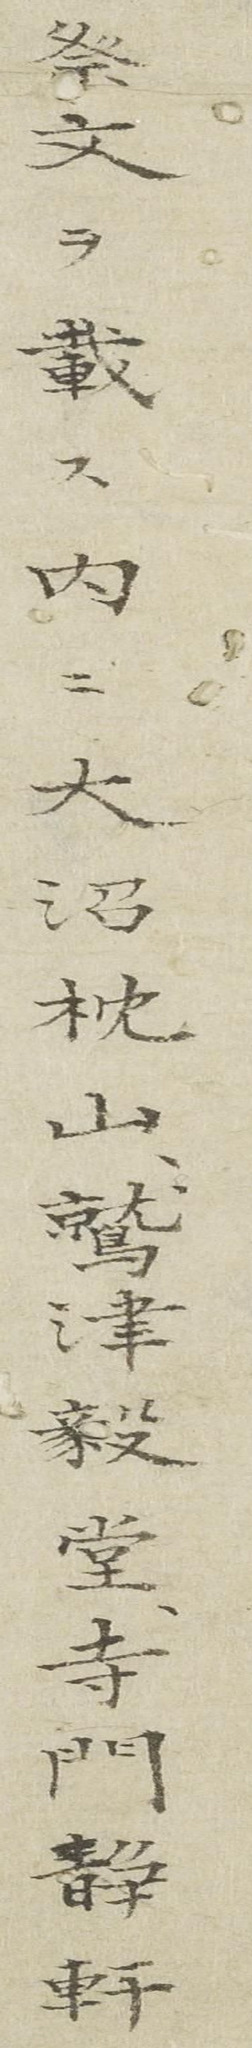祭文ヲ載ス内二大沼枕山鷲津毅堂寺門静軒
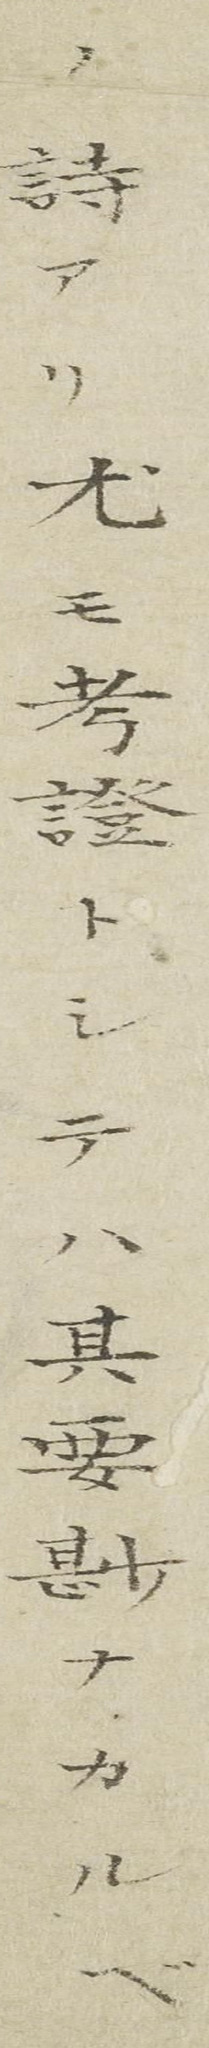ノ詩アリ尤モ考証トシテハ其要尠ナカルベ
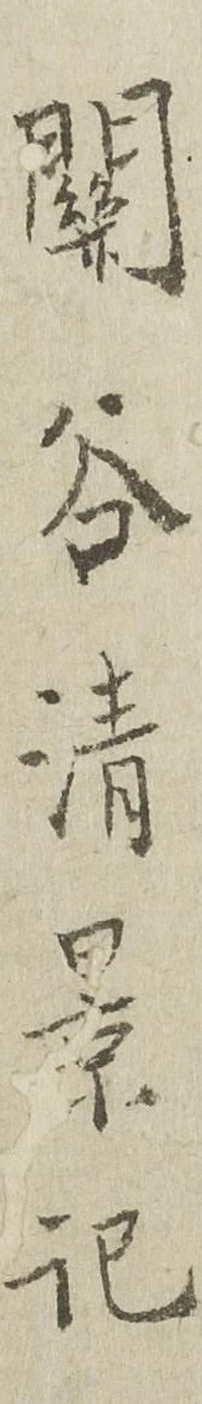關谷清景記
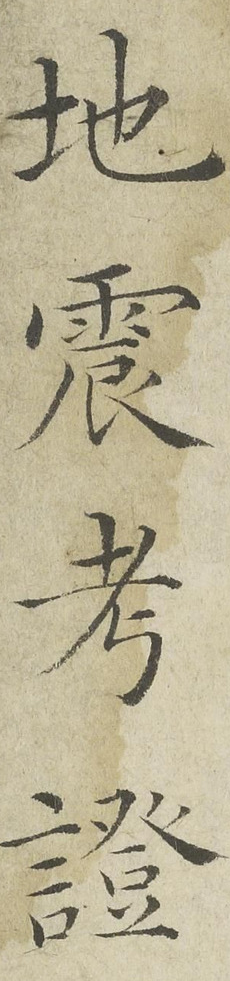地震考証

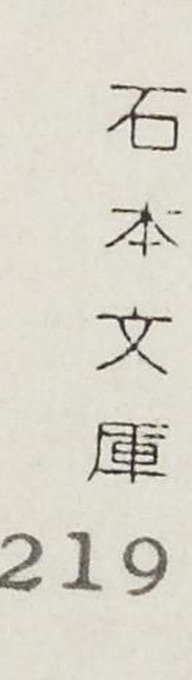石本文庫
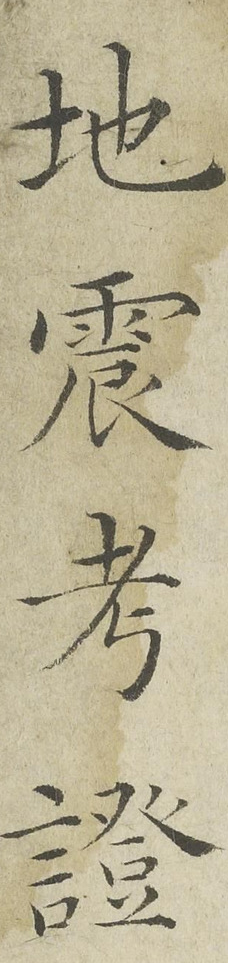地震考証

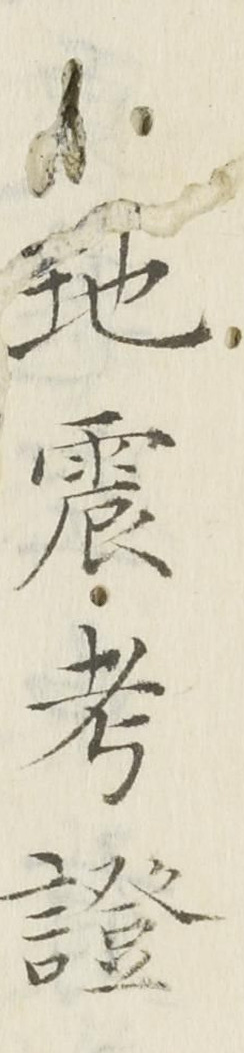地震考證
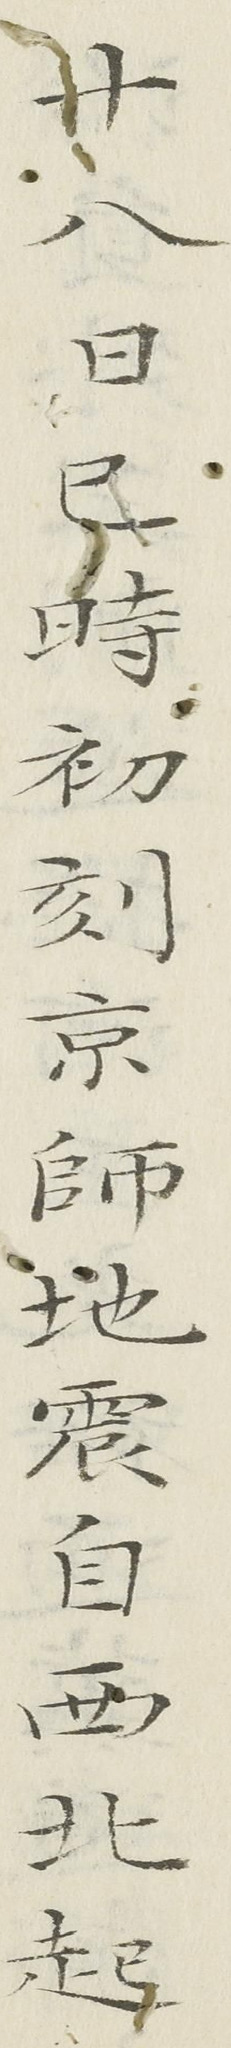廿八日巳時初刻京師地震自西北起
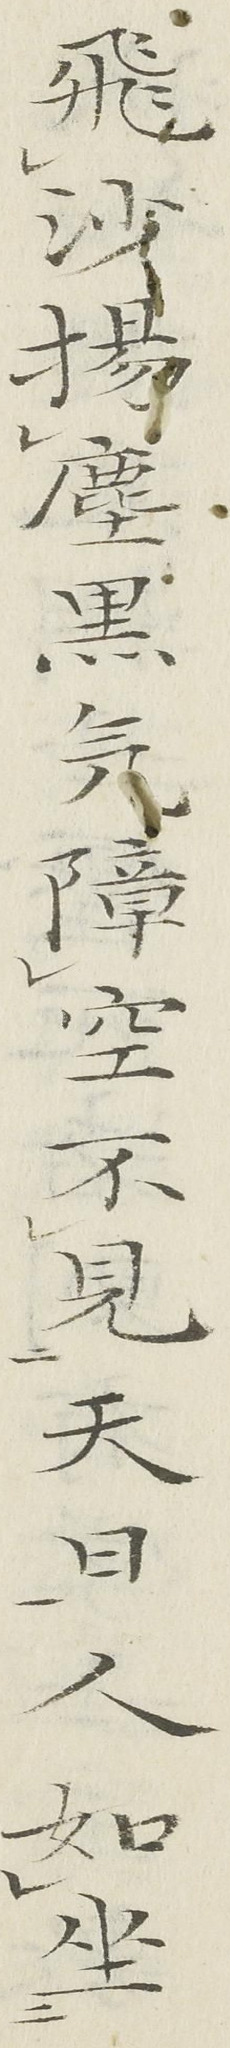飛沙揚塵黒気障空不見天日人如坐
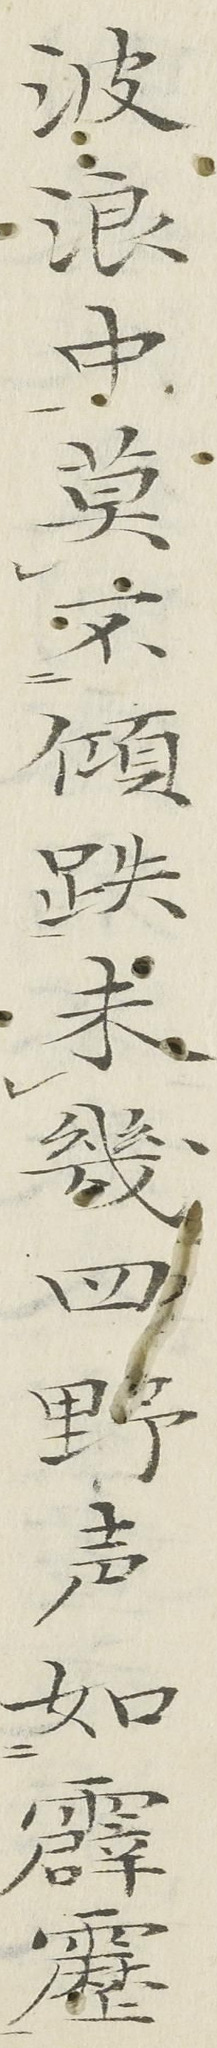波浪中莫不傾跌未幾四野声如霹靂
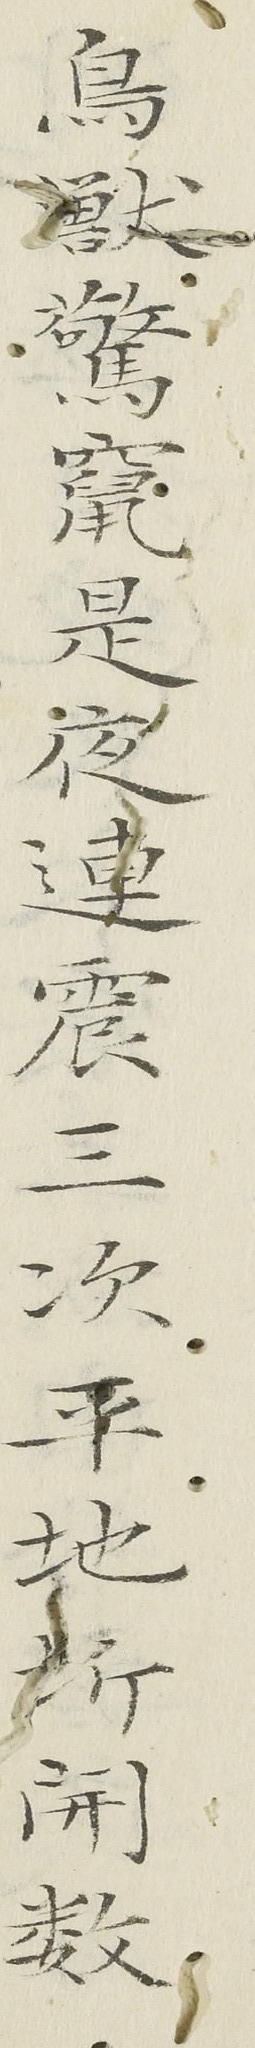鳥獣驚鼠是夜連震三次平地折？開数
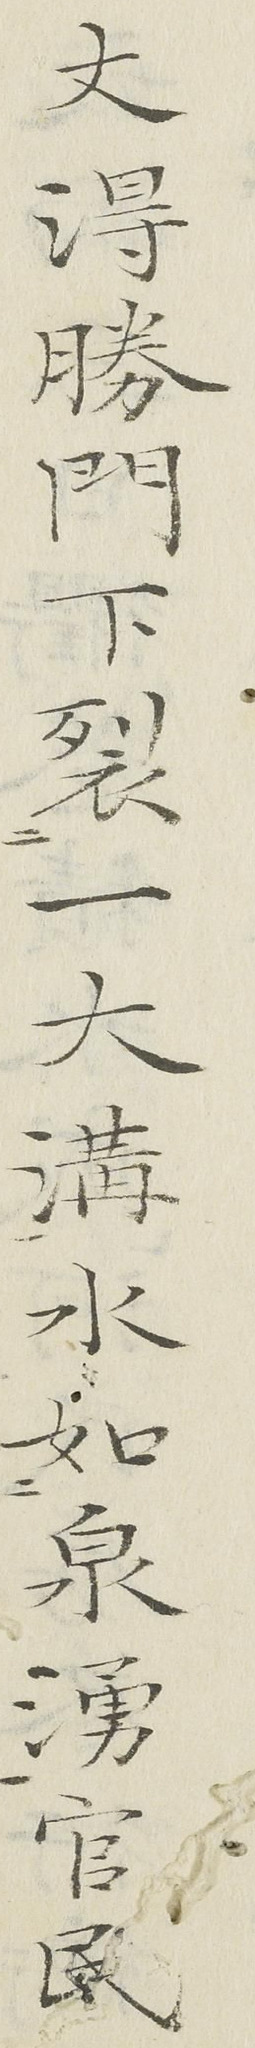丈得勝門下裂一大溝水如泉湧官民
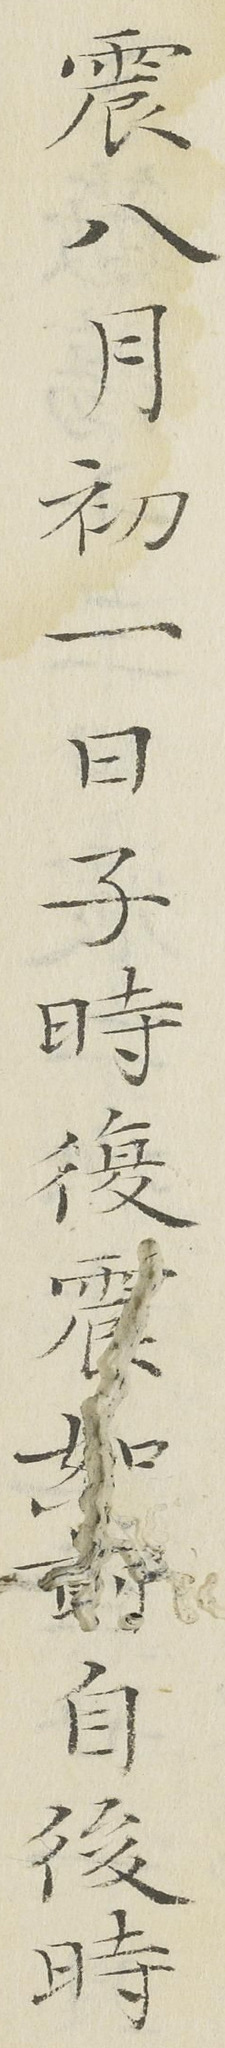震八月初一日子時復震如前自後時

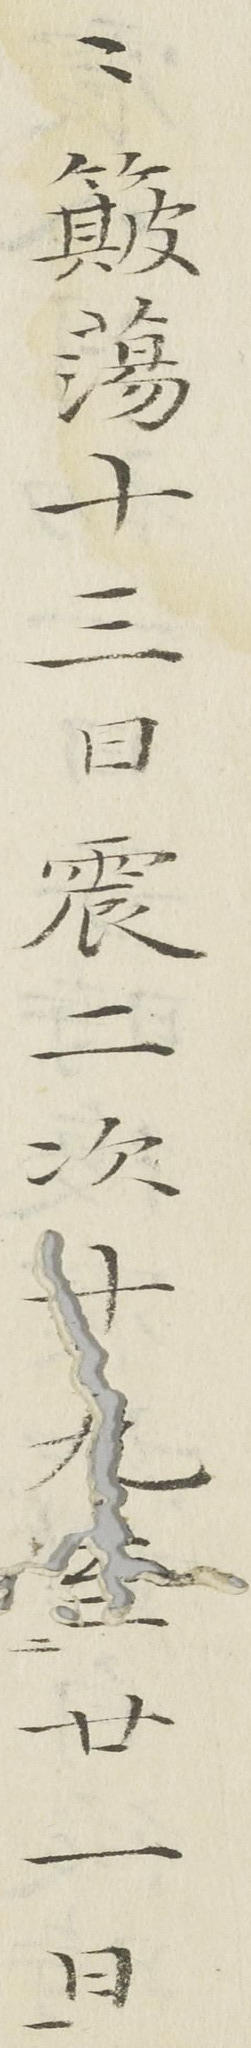々簸蕩十三百震二次十九至廿一日
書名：地震考證　全
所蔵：東京大学地震研究所図書室 Earthquake Research Institute Library, The University of Tokyo, JAPAN
